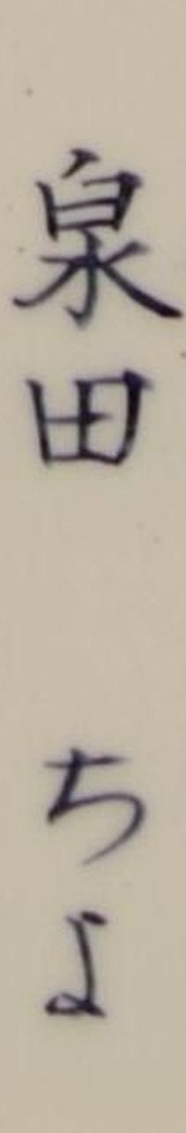泉田ちよ
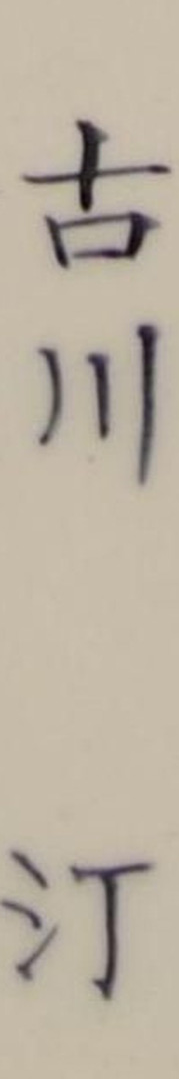古川汀
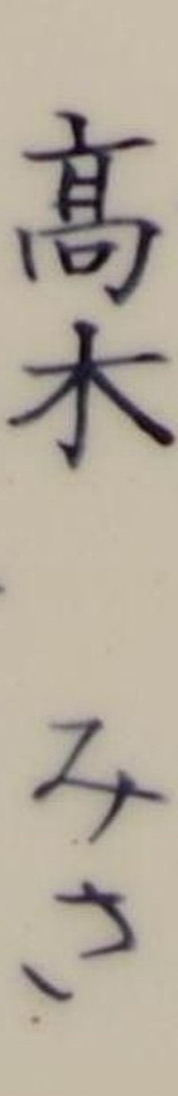高木みさ
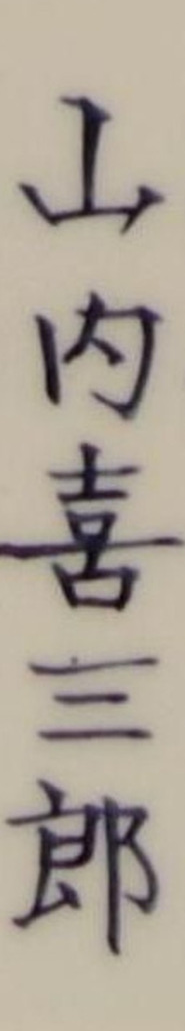山内喜三郎
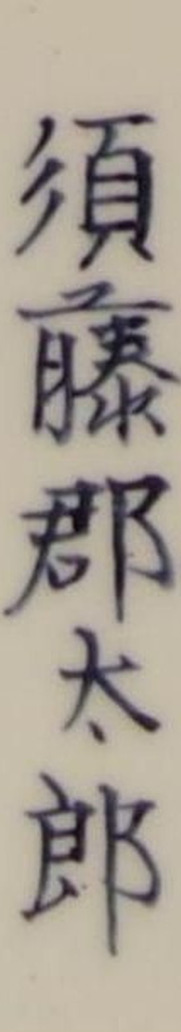須藤郡太郎
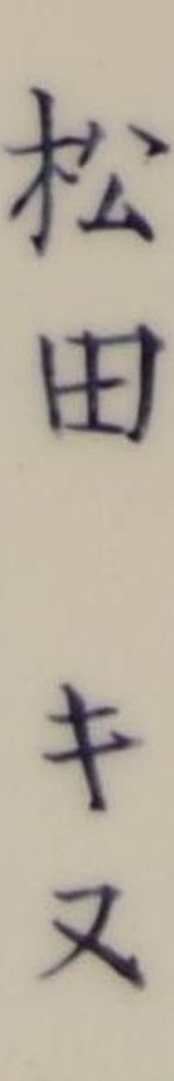松田キヌ
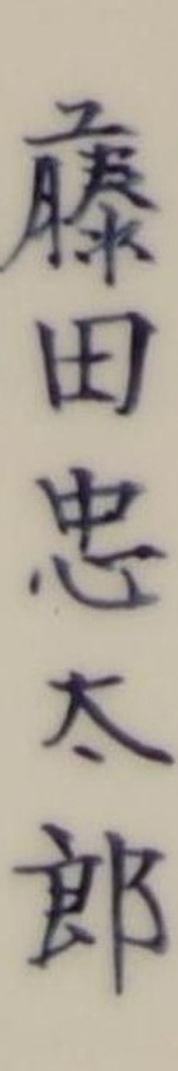藤田忠太郎
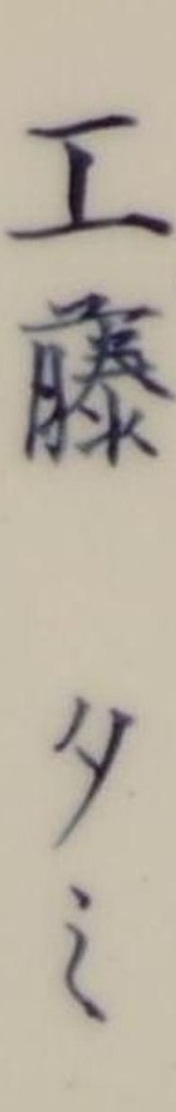工藤夕ミ
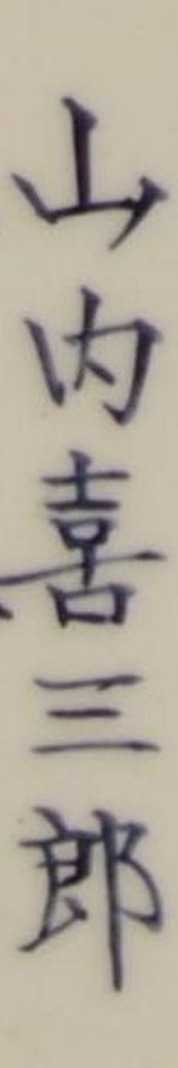山内喜三郎
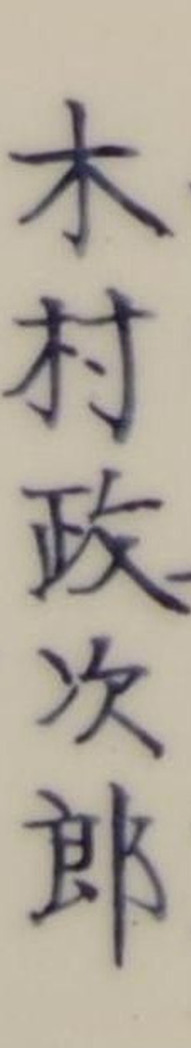木村政次郎
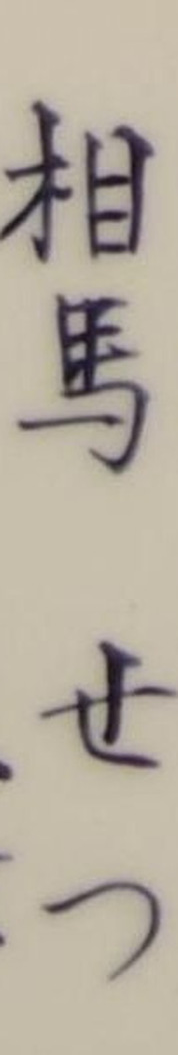相馬せつ
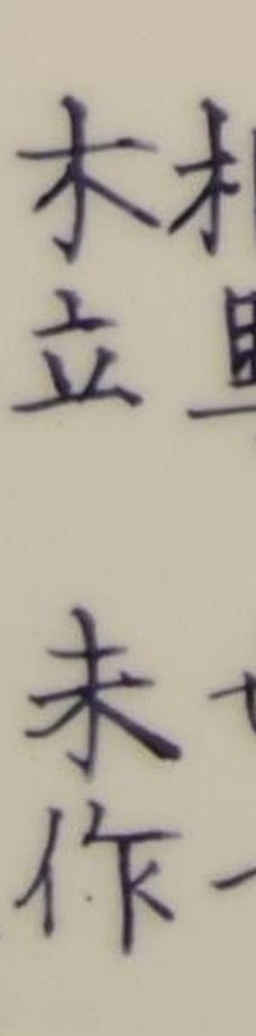木立未作
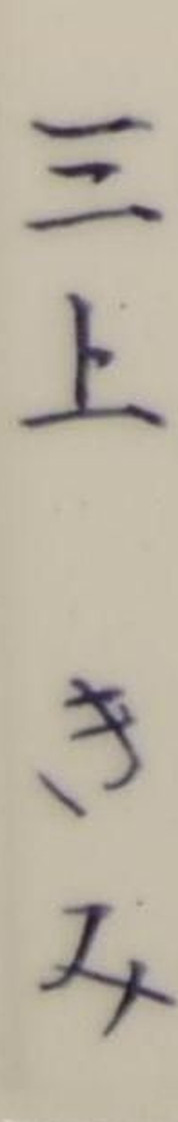三上きみ

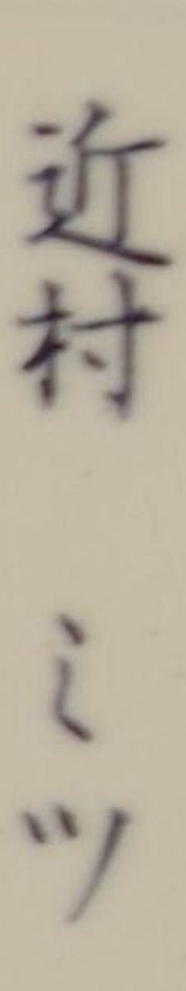近村ミツ
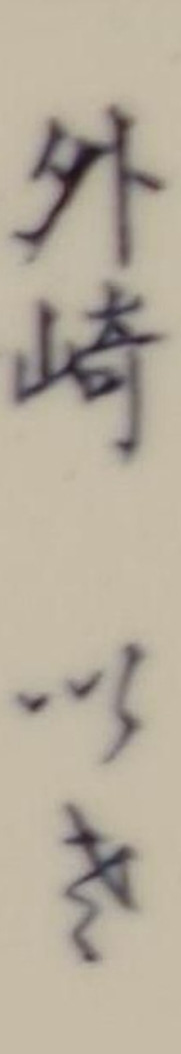外崎いき
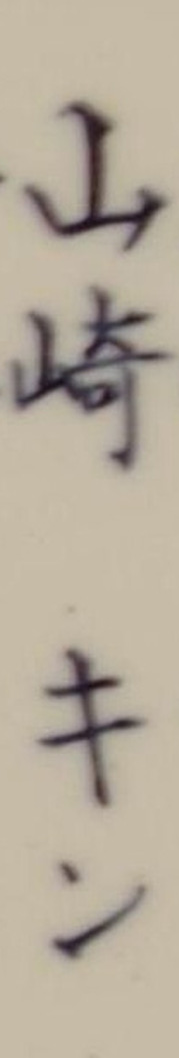山崎キン
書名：M~S
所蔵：高野山金剛峯寺
